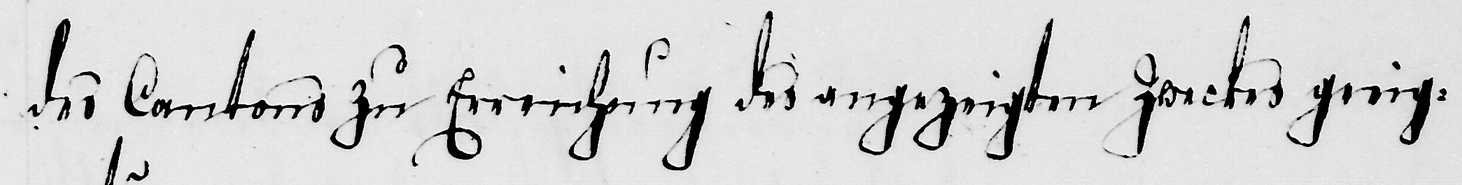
des Cantons zu Erreichung des angezeigten Zweckes geeig¬
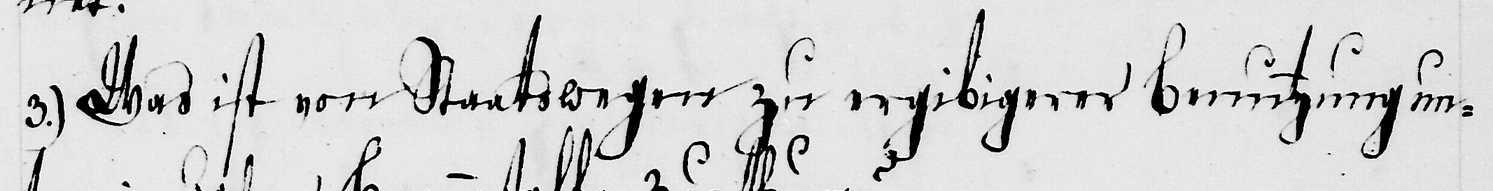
3.) Was ist von Staatswegen zu ergiebigerer Benutzung un¬
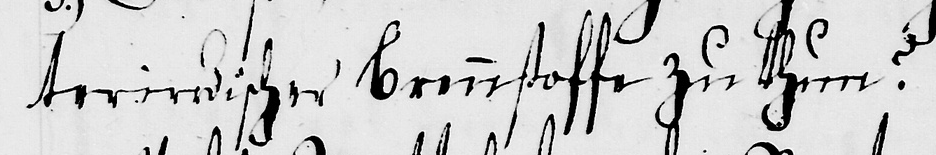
terirdischer Brennstoffe zu thun?
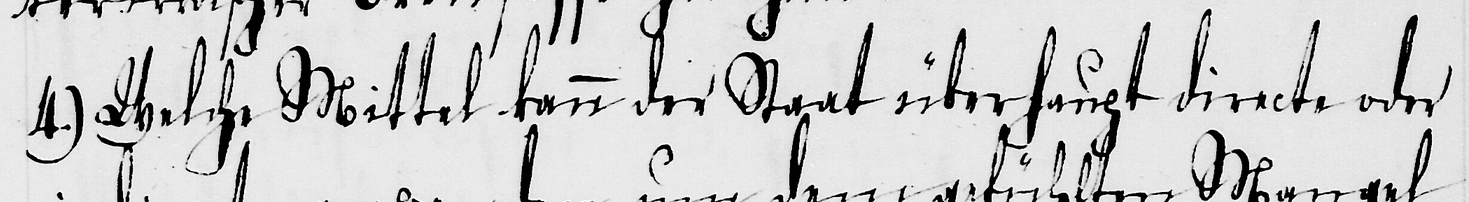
4.) Welche Mittel kann der Staat überhaupt directe oder
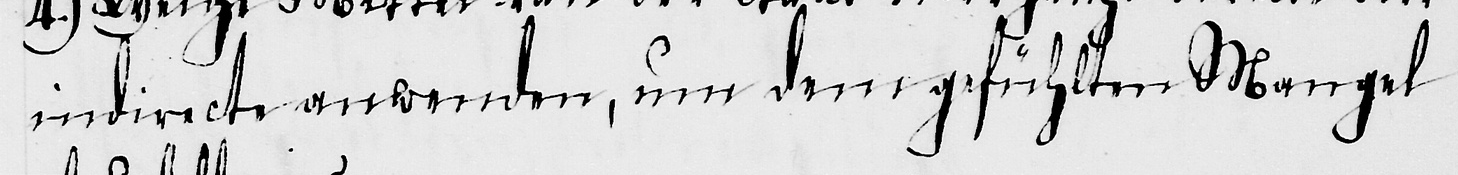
indirecte anwenden, um dem gefühlten Mangel
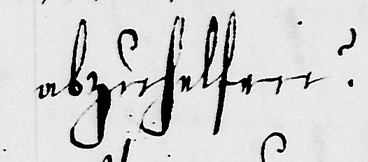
abzuhelfen?
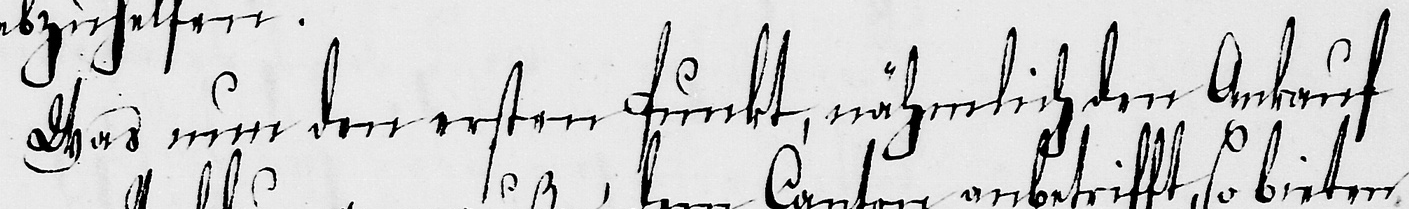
Was nun den ersten Punkt, nähmlich den Ankauf
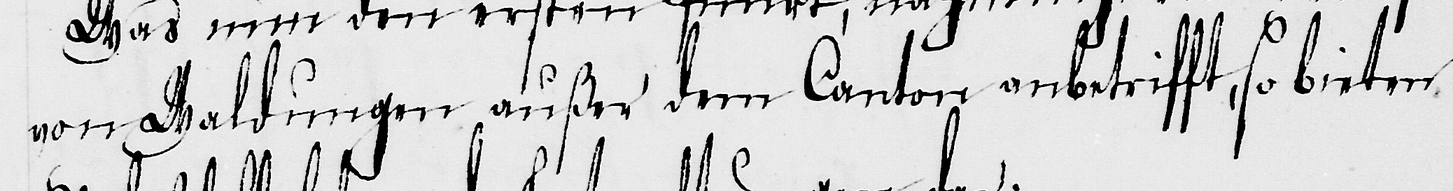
von Waldungen außer dem Canton anbetrifft, so bieten
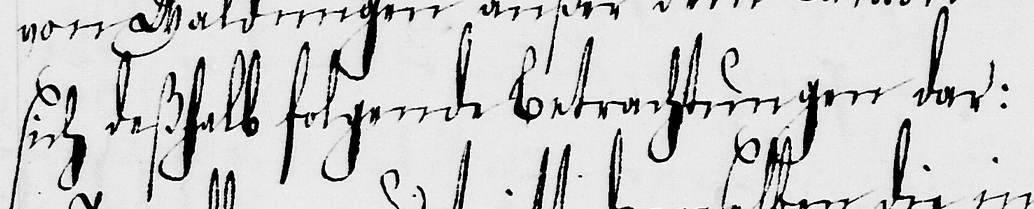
ch deßhalb folgende Betrachtungen dar:
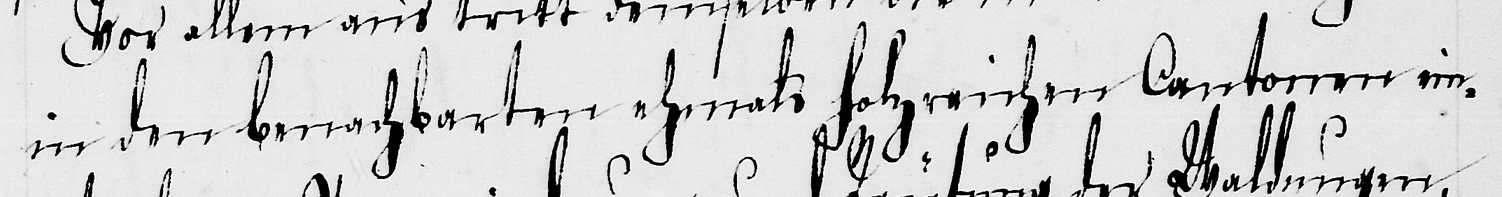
in den benachbarten ehmals holzreichen Cantonen ein¬
